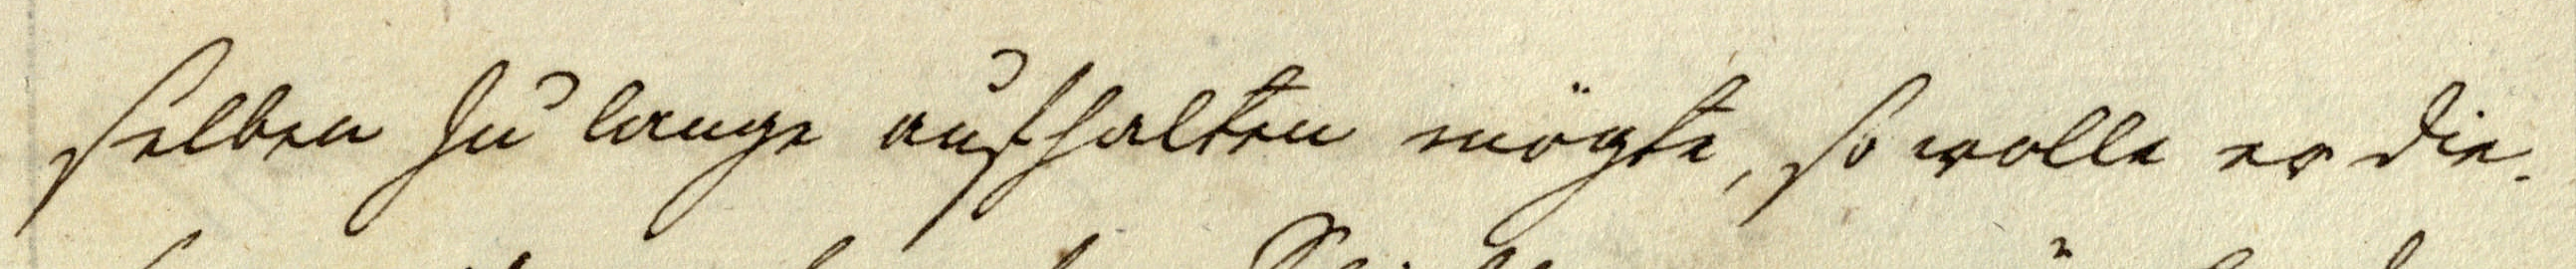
selben zu lange aufhalten mögte, so wolle er die¬
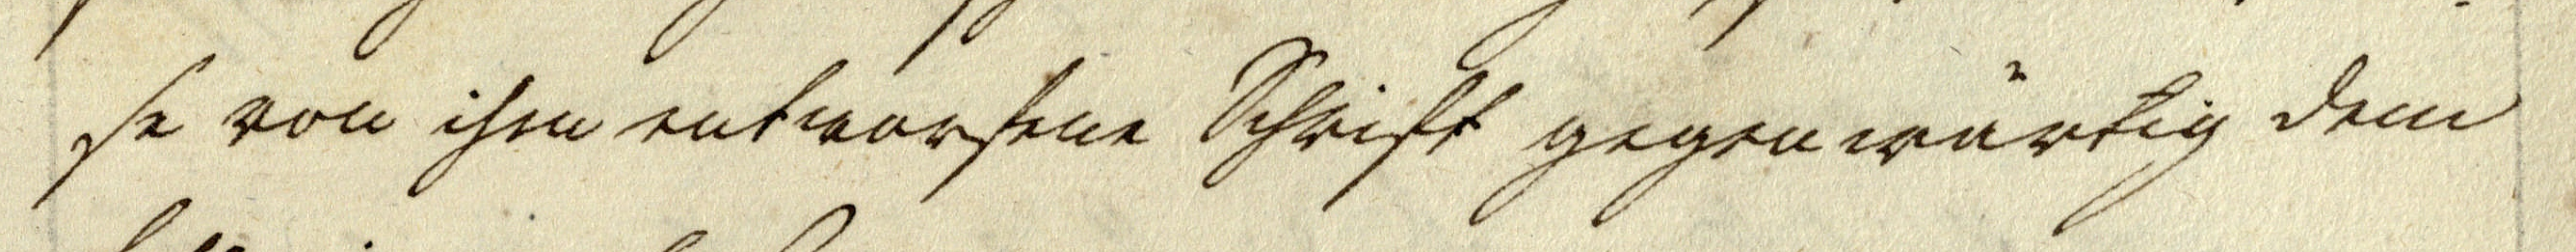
se von ihm entworfene Schrift gegen wärtig dem
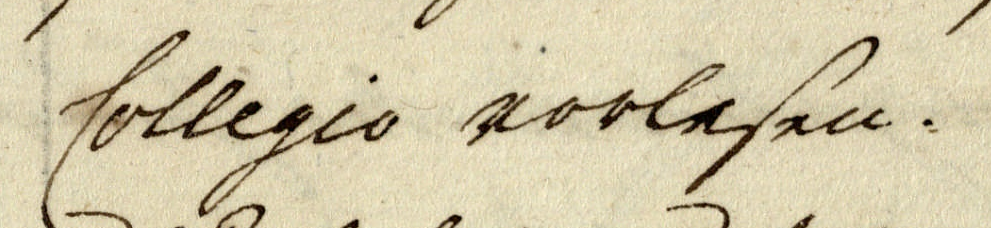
Collegio vorlesen.
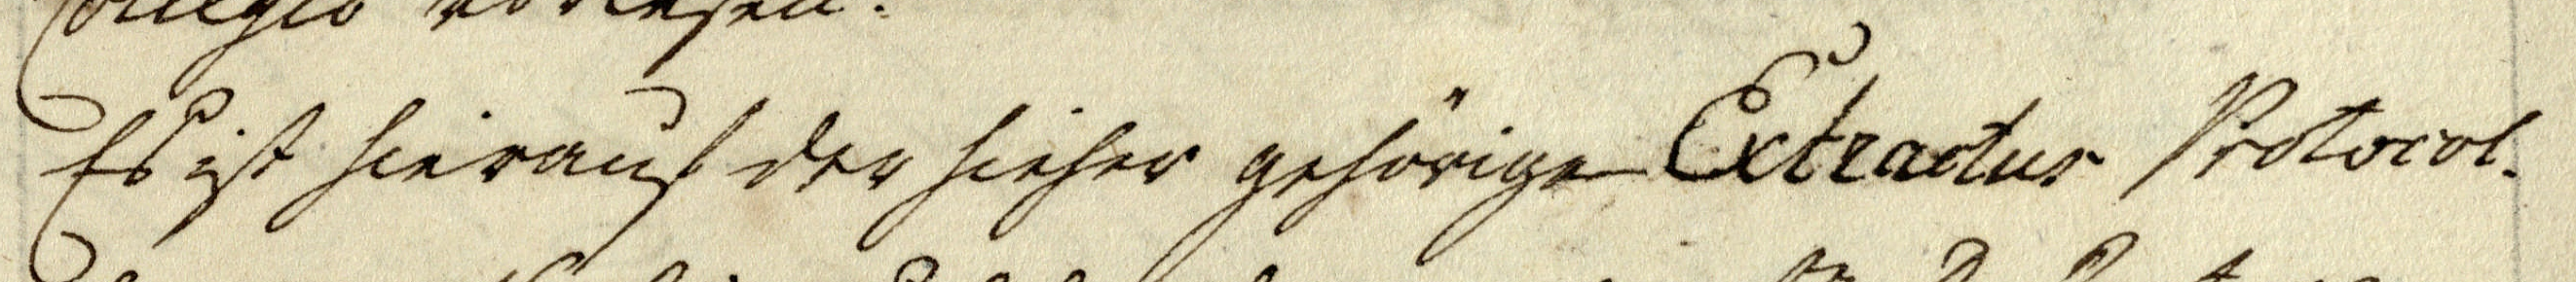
Es ist hierauf der hieher gehörige Extractus Protocol¬
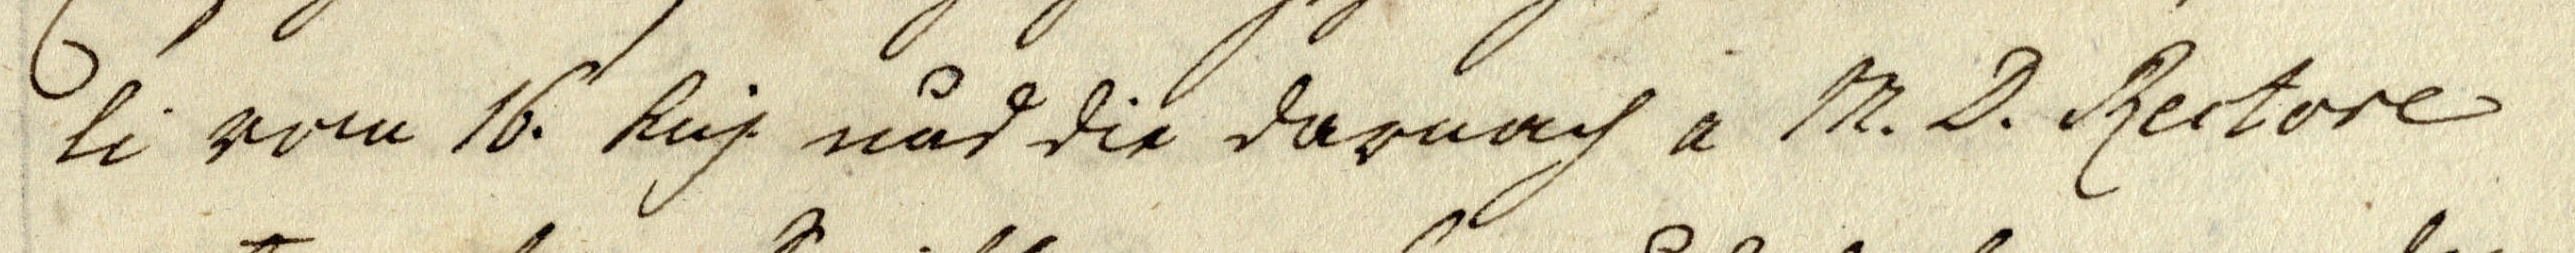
li vom 16. huj. und die darnach a M. D. Rectore
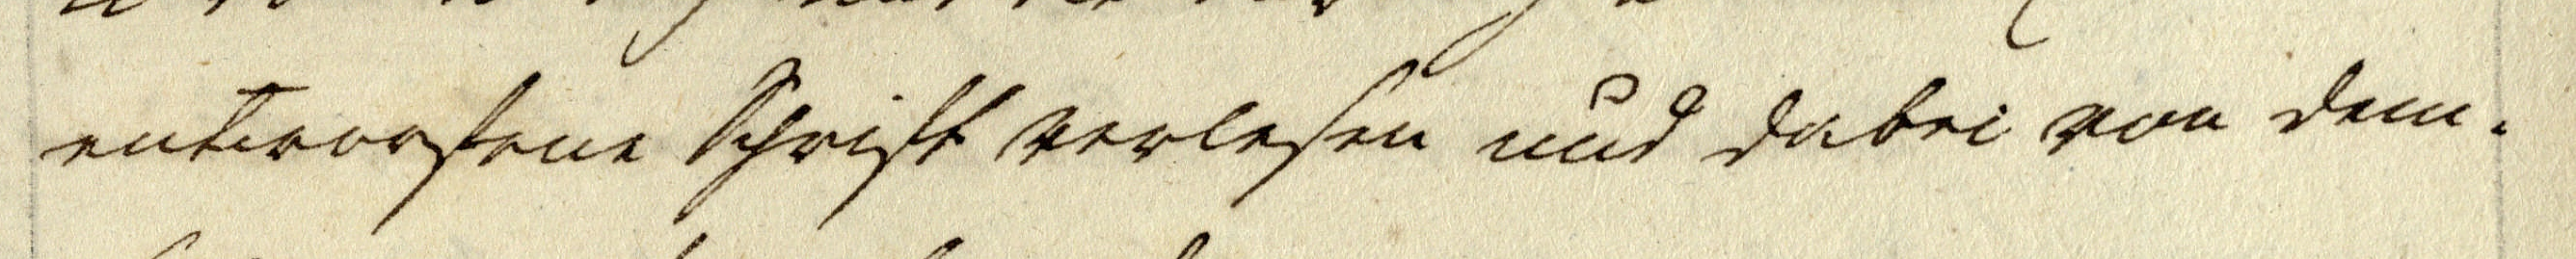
entworfene Schrift verlesen und dabei von dem¬
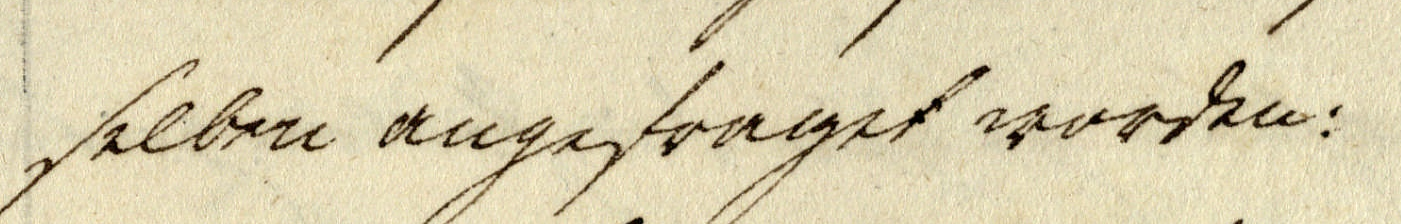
selben angefraget worden:
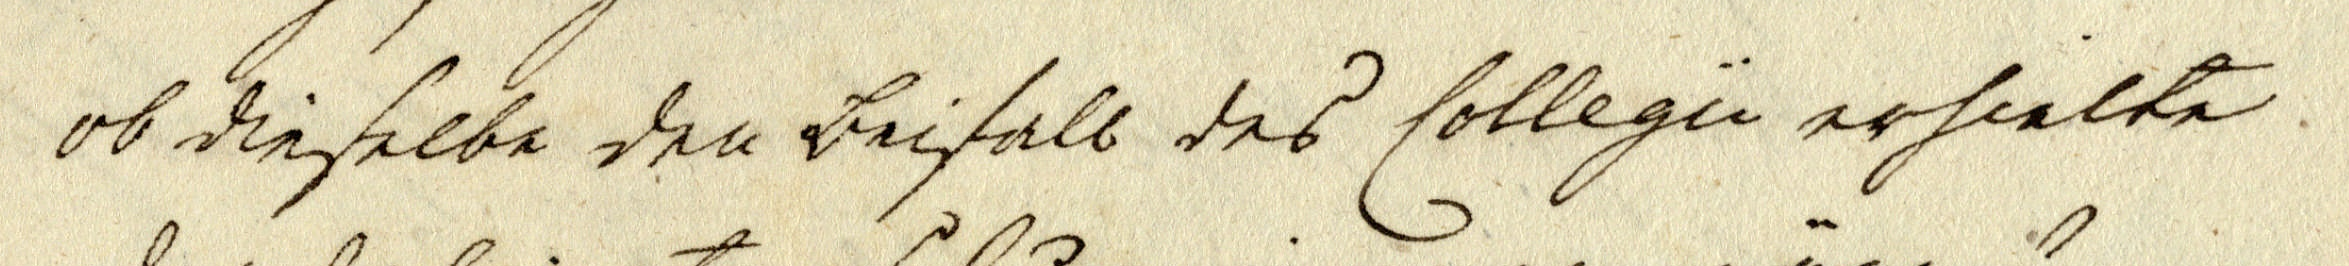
ob dieselbe den Beifall des Collegii erhielte
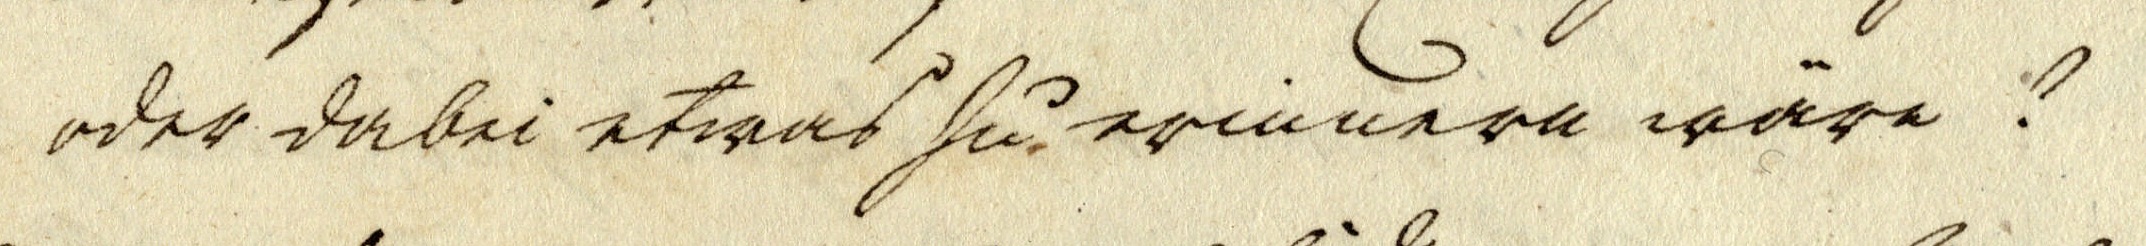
oder dabei etwas zu erinnern wäre?
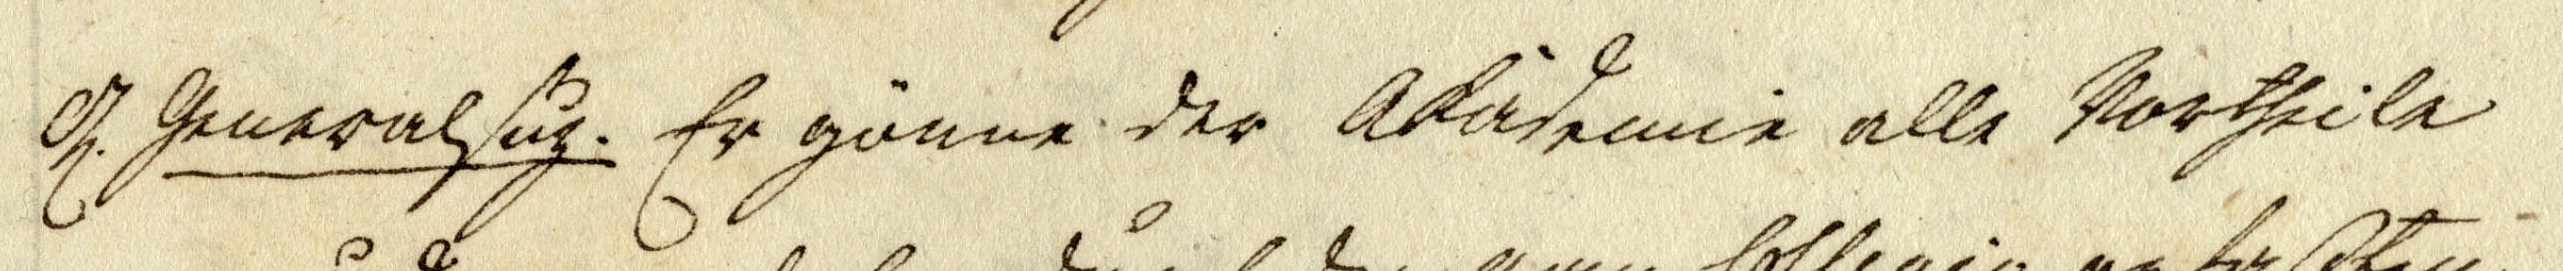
dh. Generalsup. Er gönne der Akademie alle Vortheile
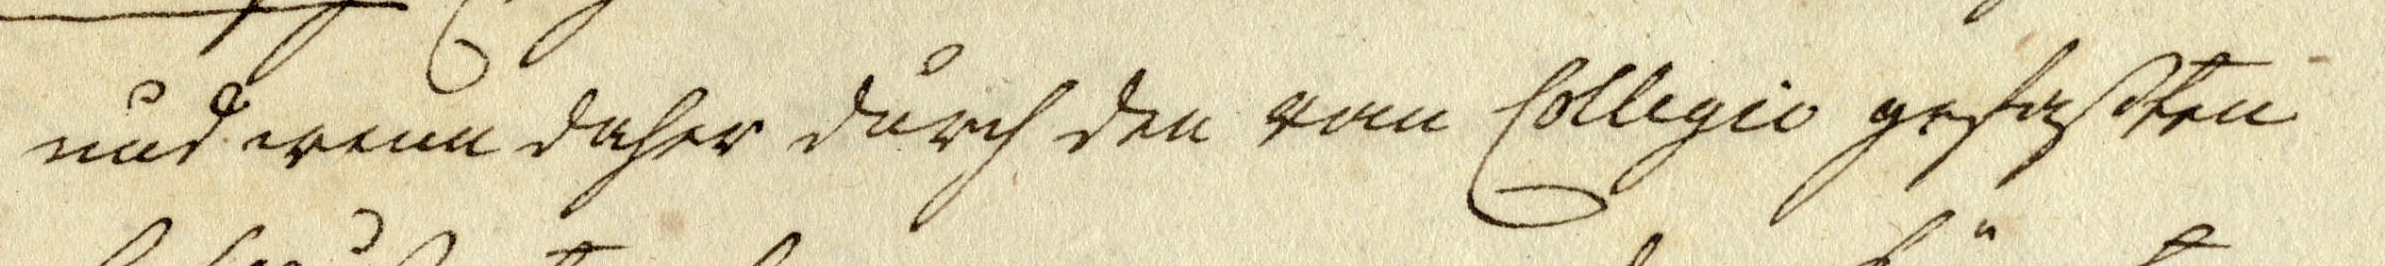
und wenn daher durch den vom Collegio gefaßten
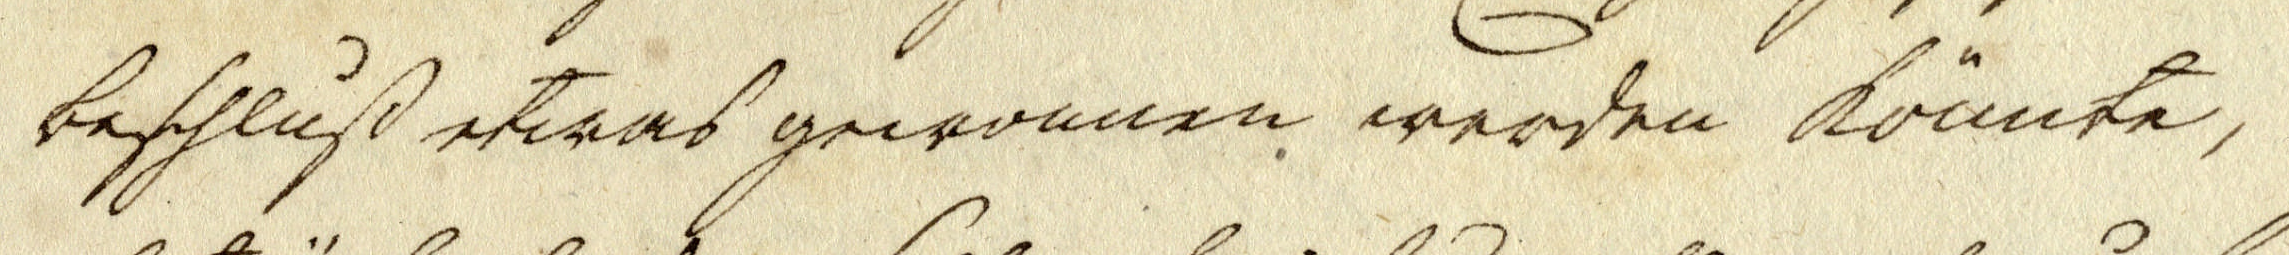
Beschluß etwas gewonnen werden könnte,
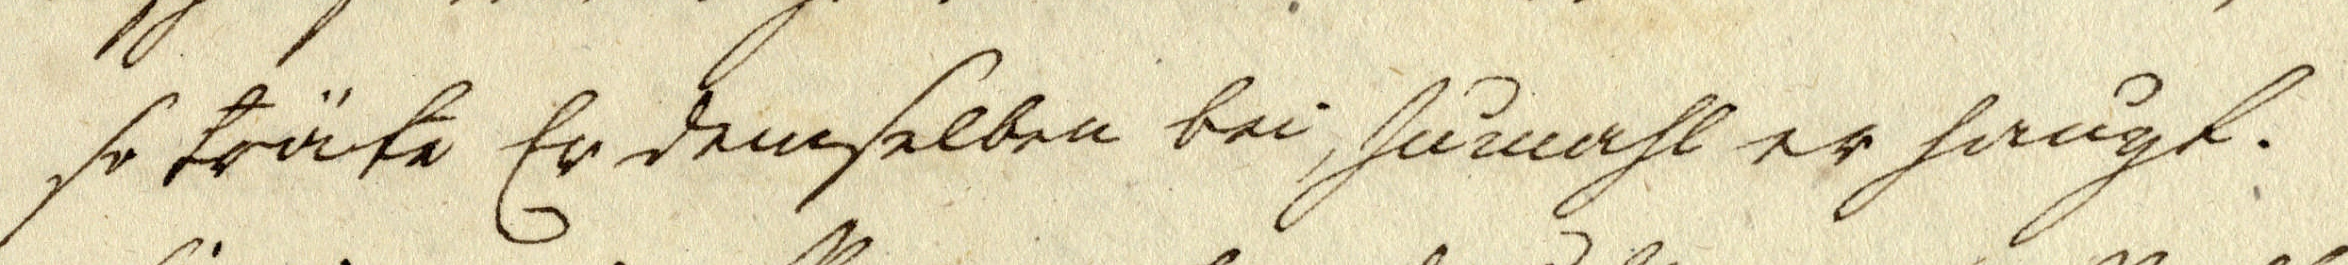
so träte Er demselben bei, zumahl er haupt¬
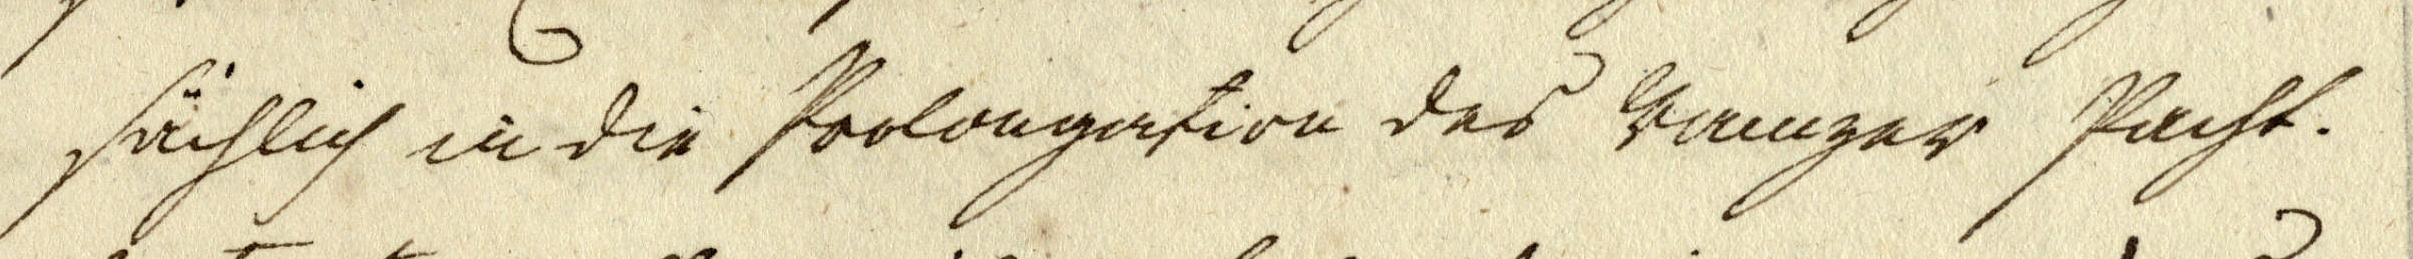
sächlich in die Prolongation des Wamper Pacht¬
